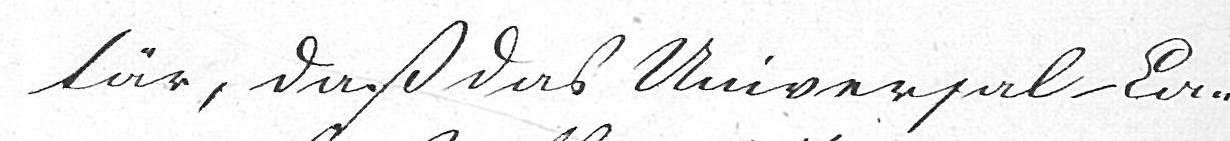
tär, daß das Universal-Ca-
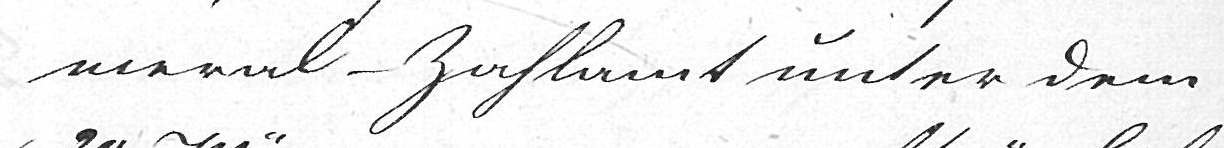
meral-Zahlamt unter dem
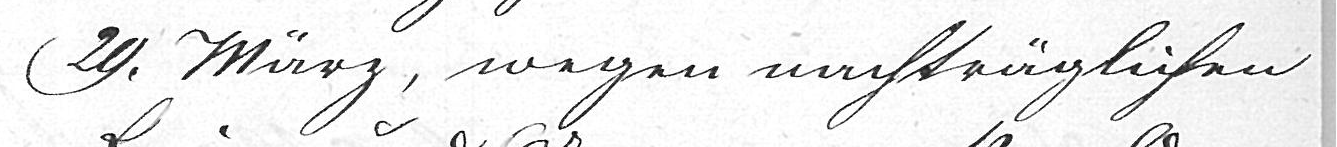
29. März, wegen nachträglichen
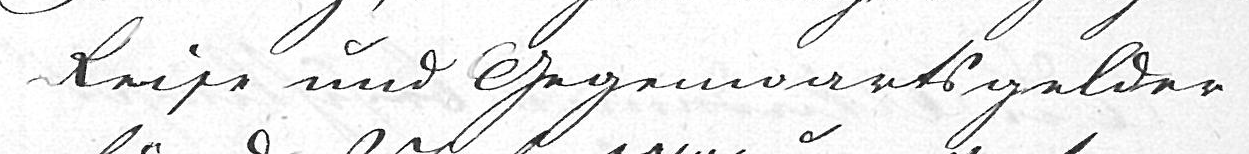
Reise und Gegenwartsgelder
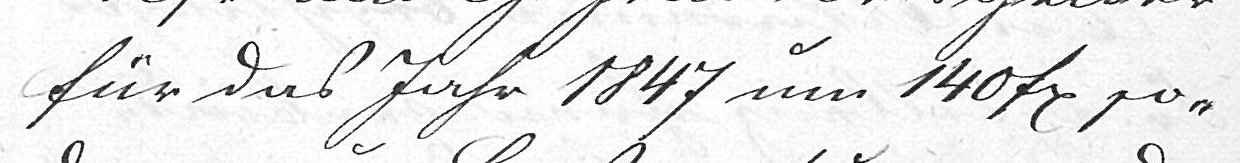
für das Jahre 1847 um 140 fl so-
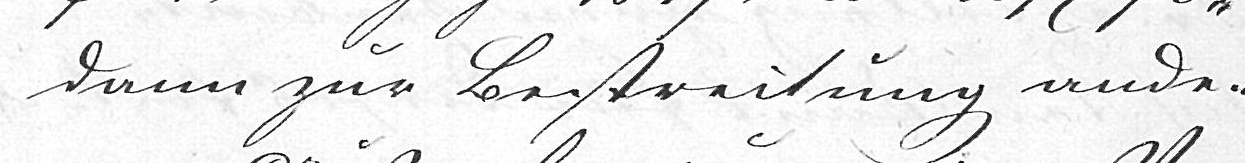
dann zur Bestreitung ande-
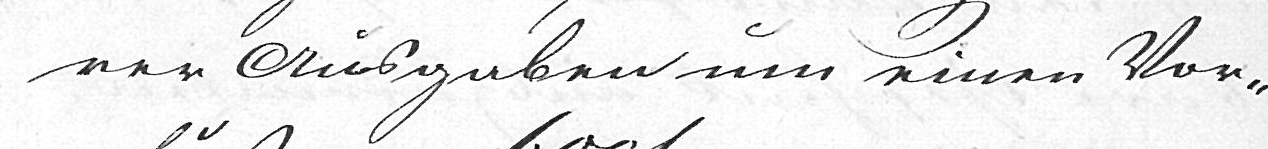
rer Ausgaben um einen Vor-
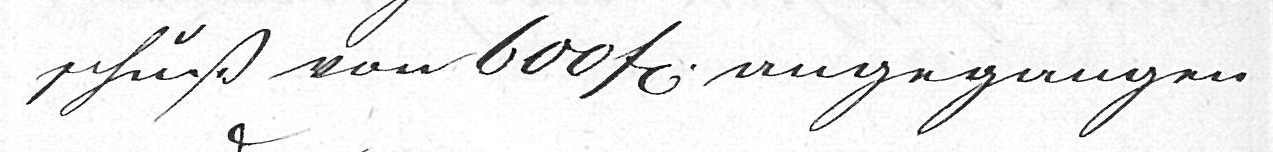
schluß von 600 fl angegangen
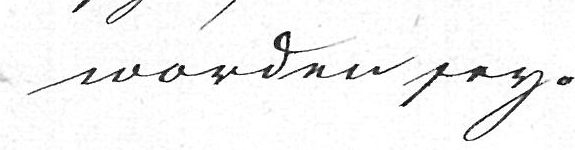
worden sey.
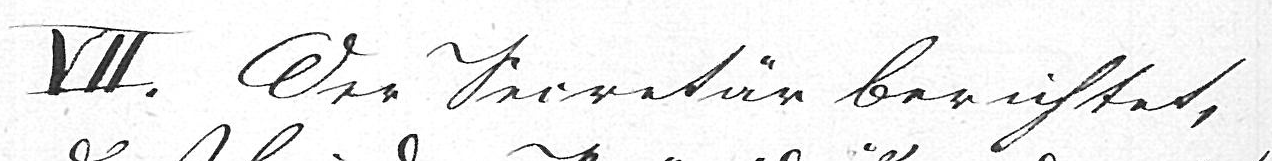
VII. Der Secretär berichtet,
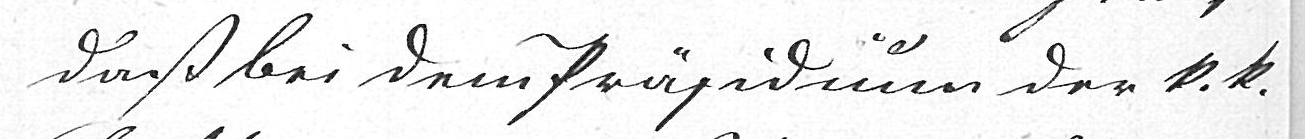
daß bei dem Präsidium der k.k.
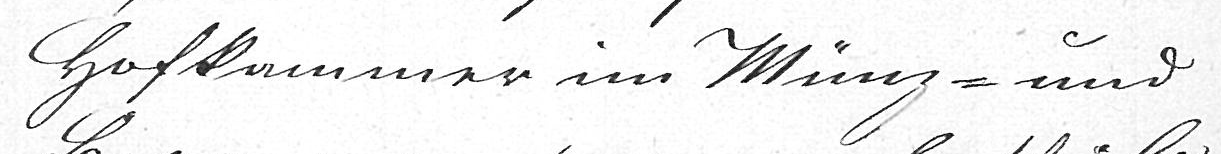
Hofkammer im Münz- und
